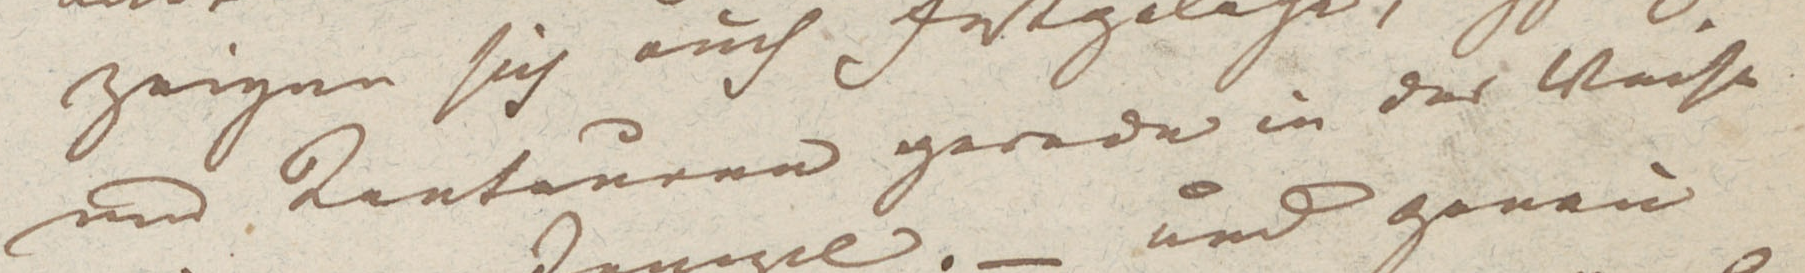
und Kentauren gerade in der Weise
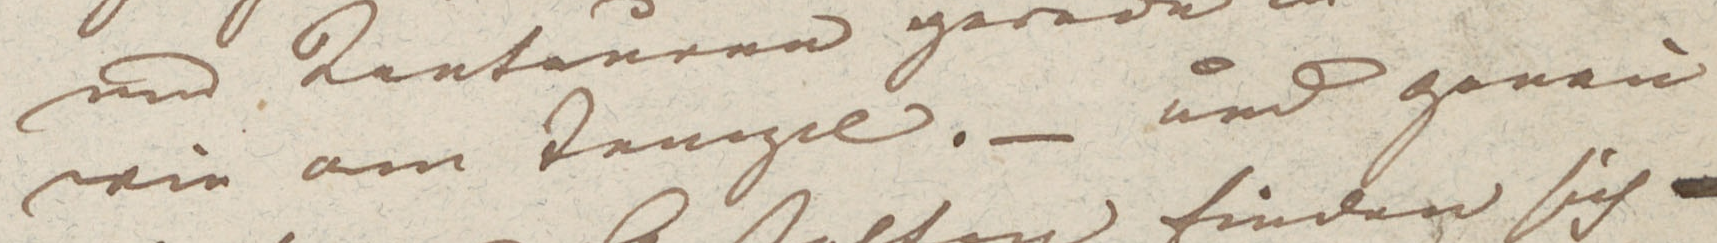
wie am Tempel. – und genau
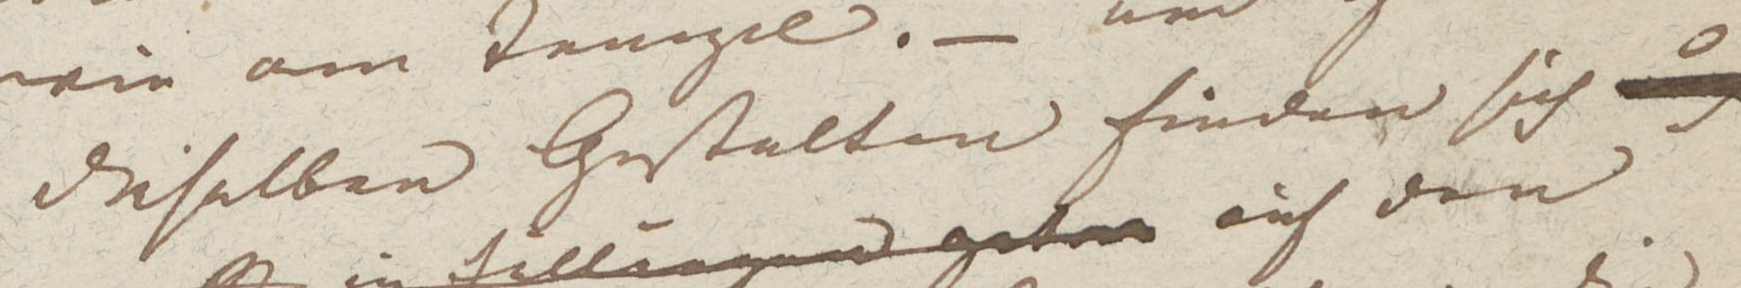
dieselben Gestalten finden sich auch
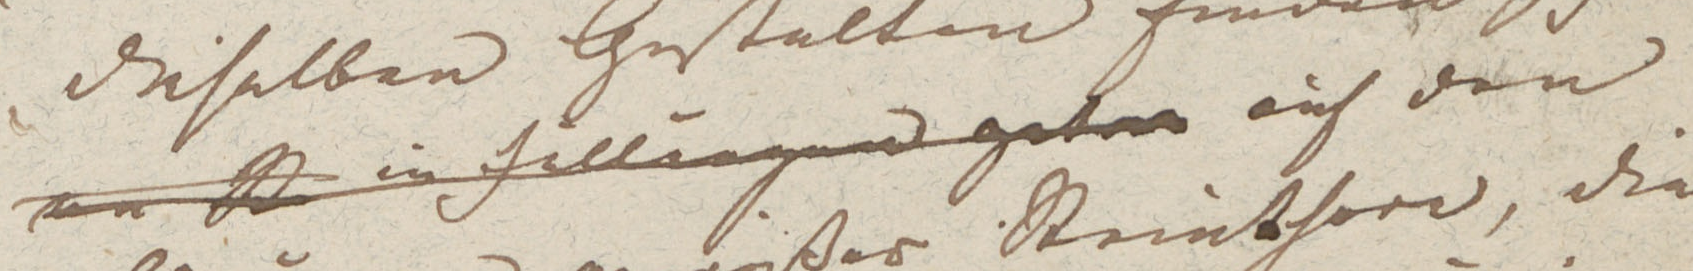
an St in Füllungen get auf den
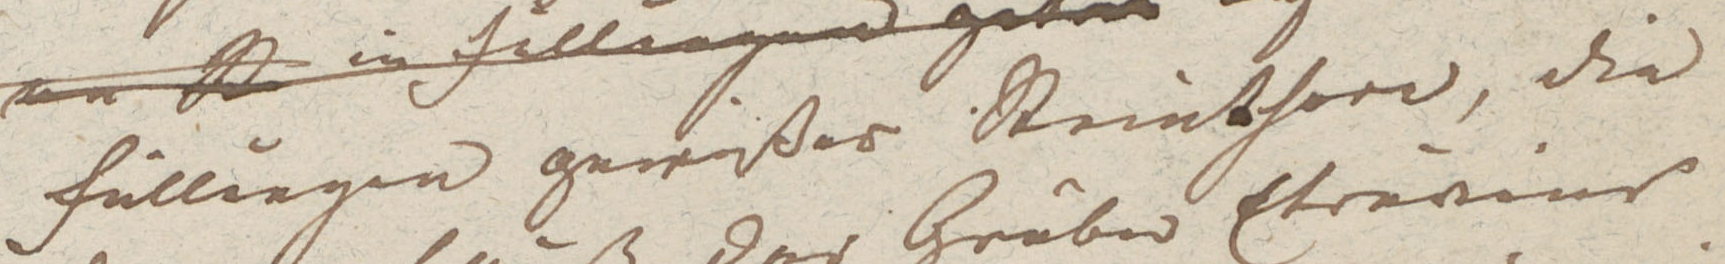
Füllungen gewisser Steinthore, die
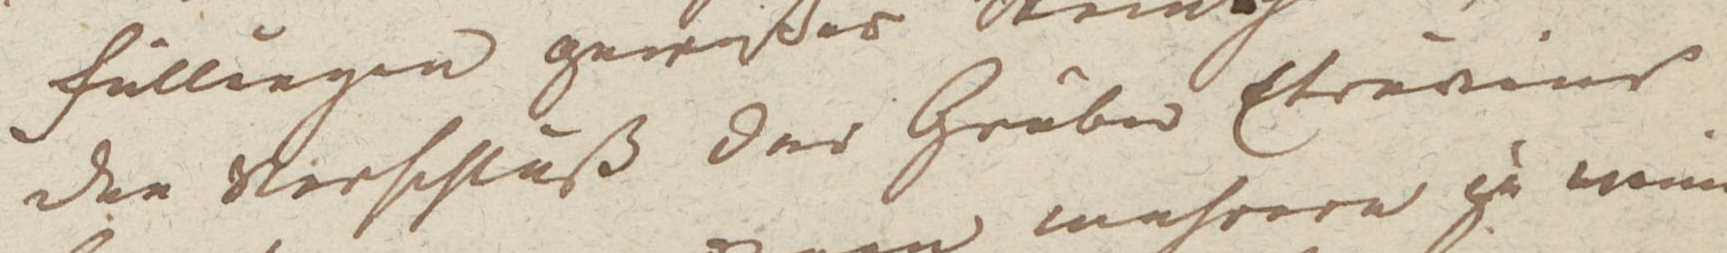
den Verschluss der Gräber Etruriens
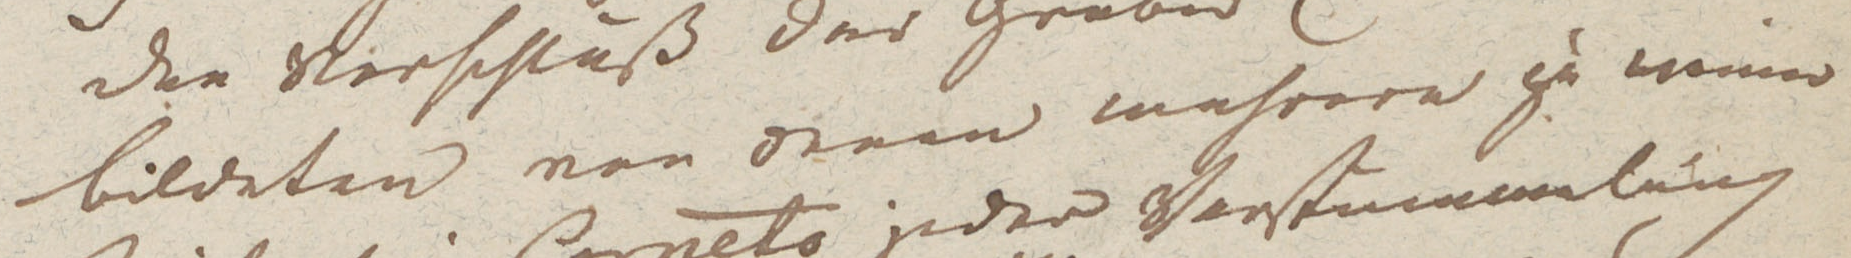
bildeten von denen mehrere zu meiner
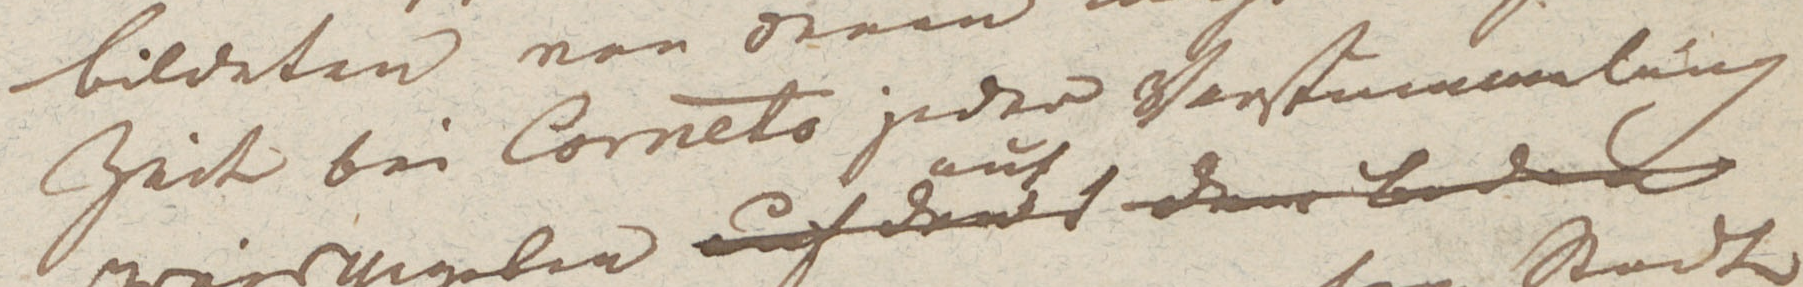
Zeit bei Corneto jeder Verstümmelung
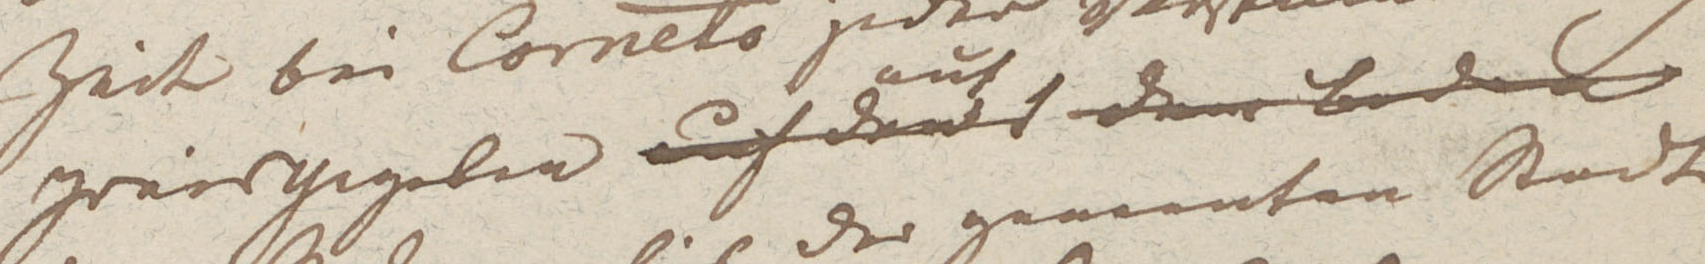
preisgegeben auf den s auf dem Boden
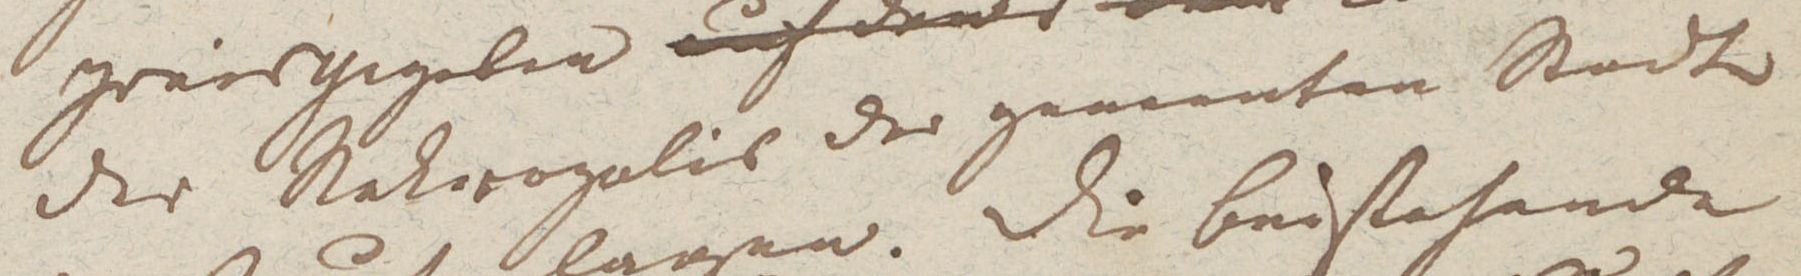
der Nekropolis der genannten Stadt
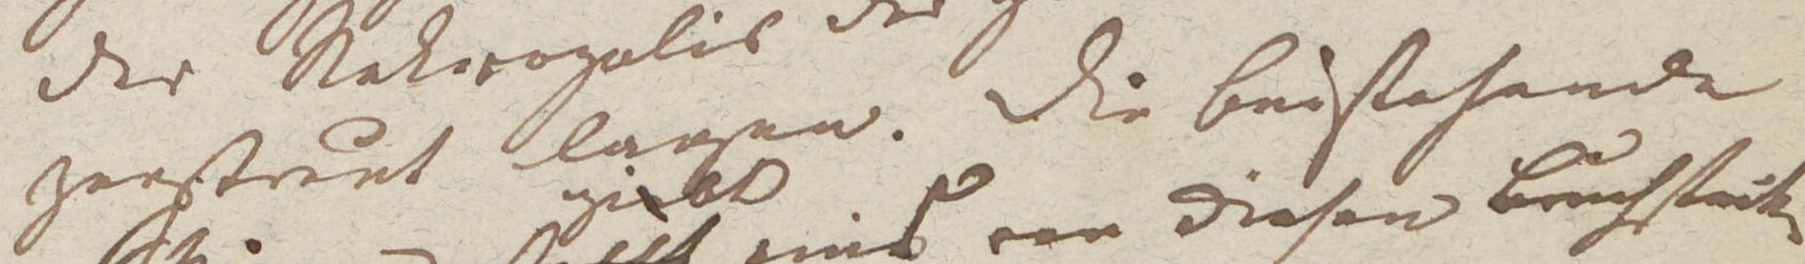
zerstreut lagen. Die beistehende
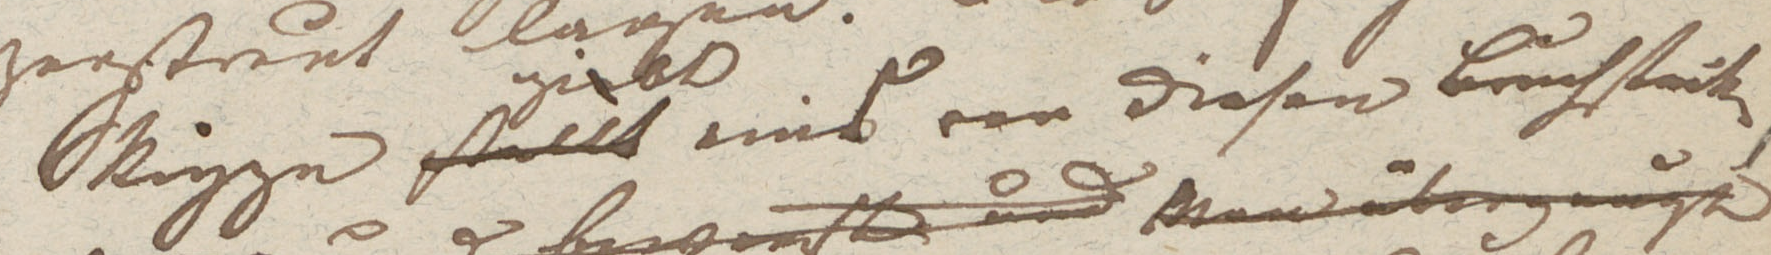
Skizze stellt giebt eins von diesen Bruchstück
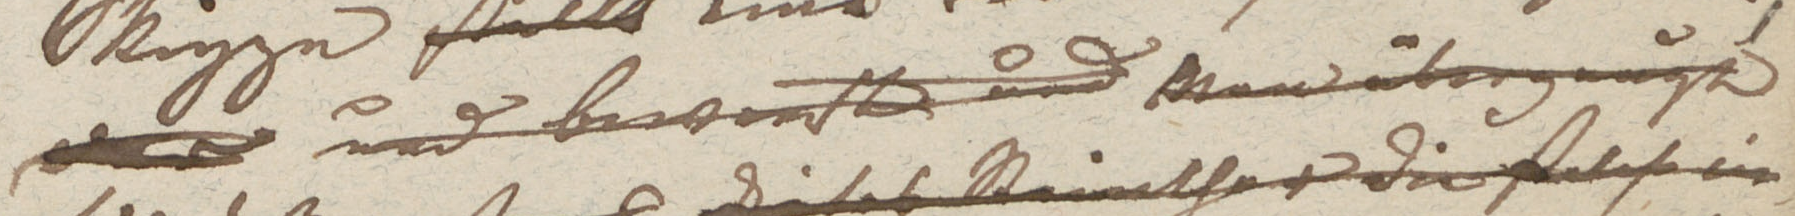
der und beweist und man überhaupt
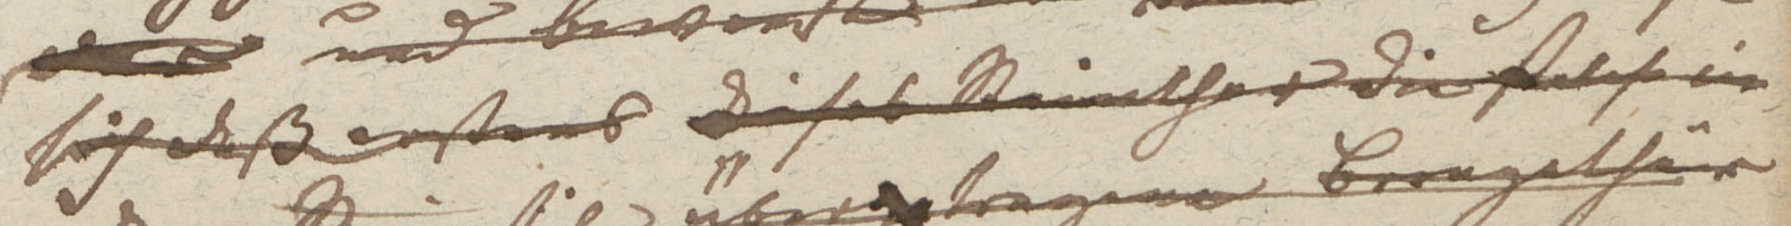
sich dass erstens dieses Steinthor die stilis in
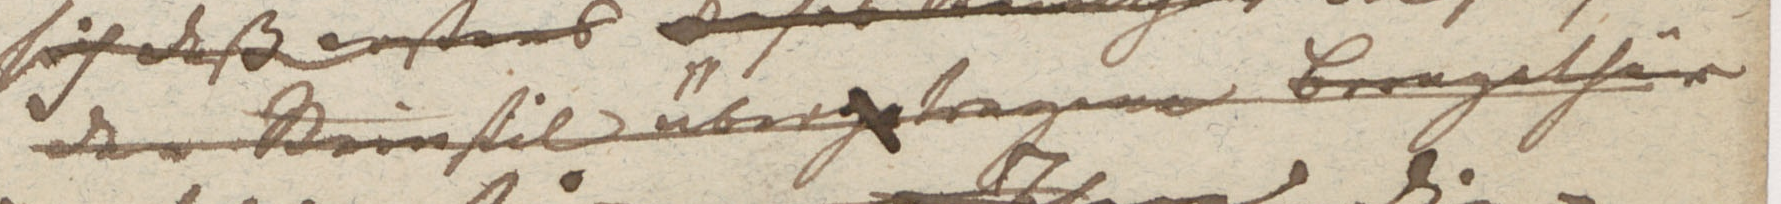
den Steinstil übergetragene Bronzethür
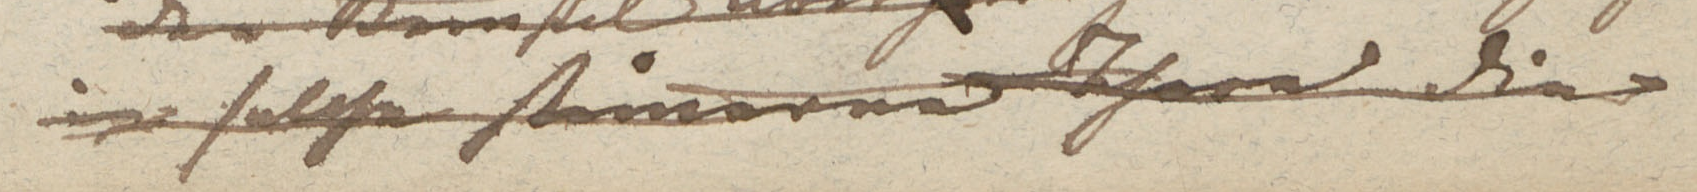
in solche steinerne THore die
